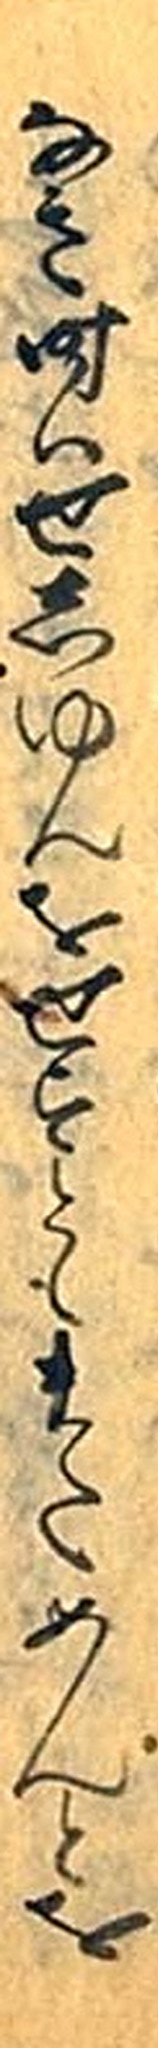なき時はせしゆんをせすともまためんとを
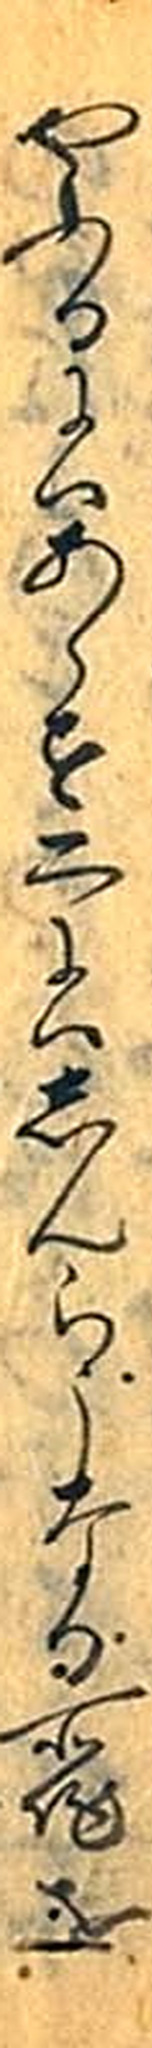やふるにはあらす二にはしんらうなる所作を
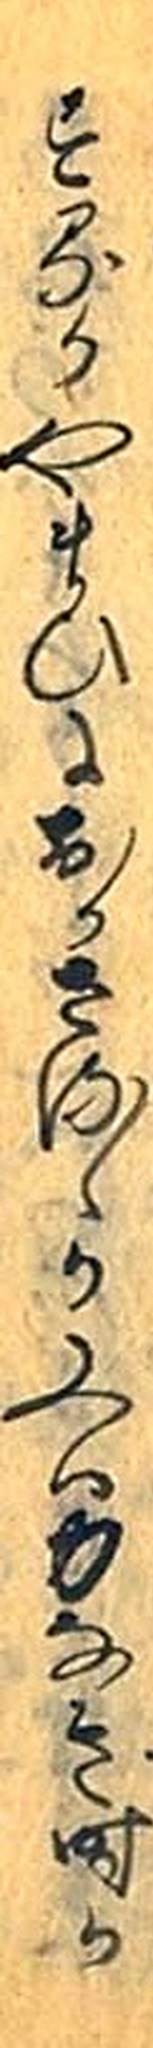するかやまひにおかさるゝか又は力なき時か
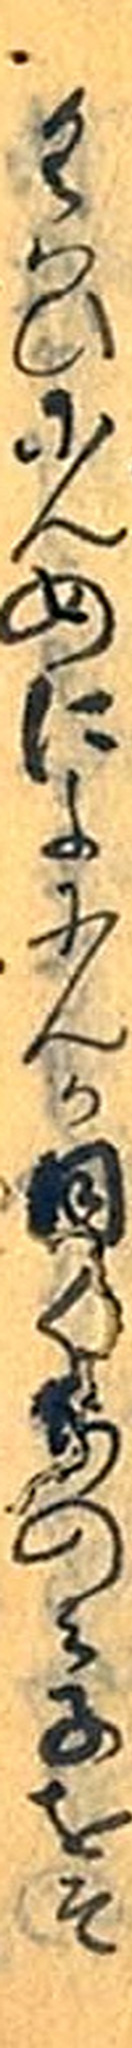くはひにんのによにんか同くちのみ子をそ
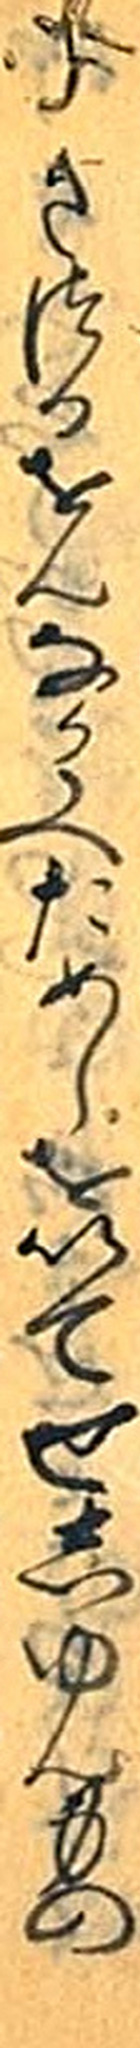たつるをんなか又ためしを以てせしゆん身の
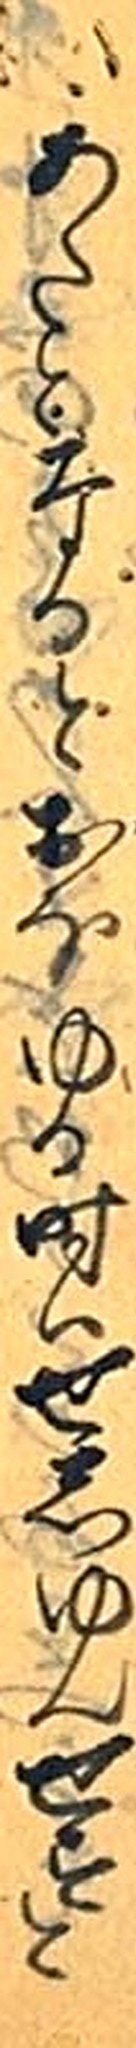あたとなるとおほゆる時はせしゆんせすと
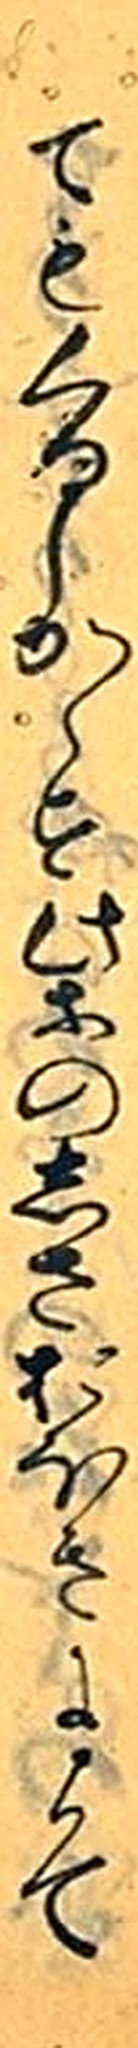てもくるしからす此等のしさおほきによて
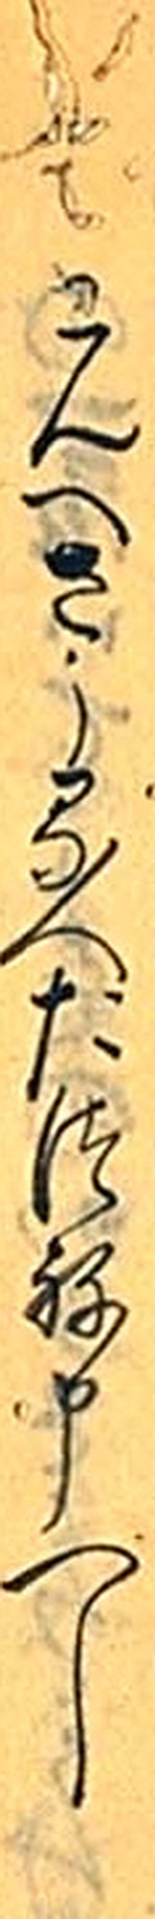こんへさうるへたつね申へし
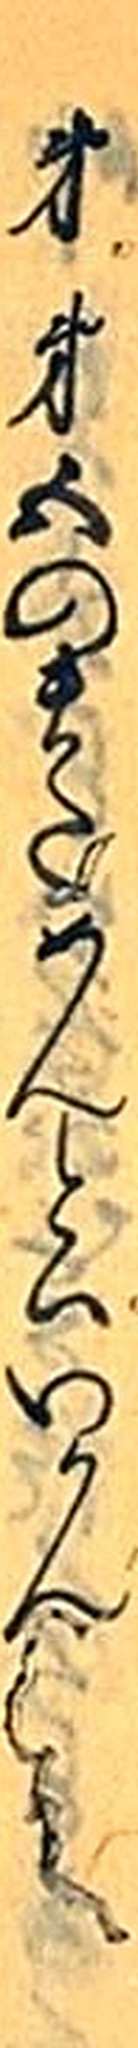弟第五のまためんとはいかん
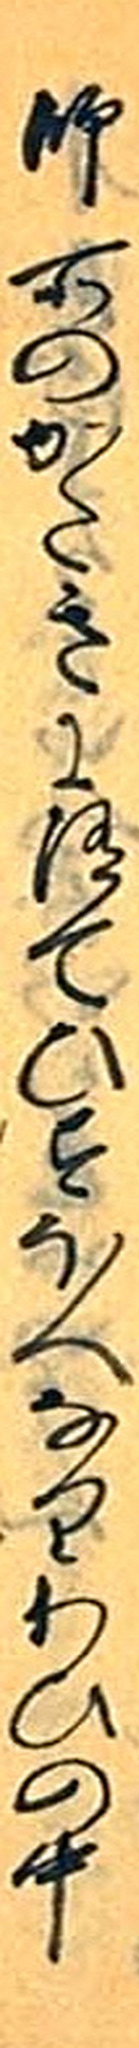師所のかたきに随てひすほへなりわひの中
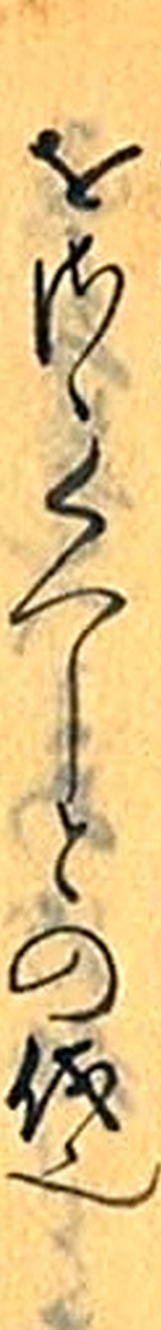をさゝくへしとの儀也
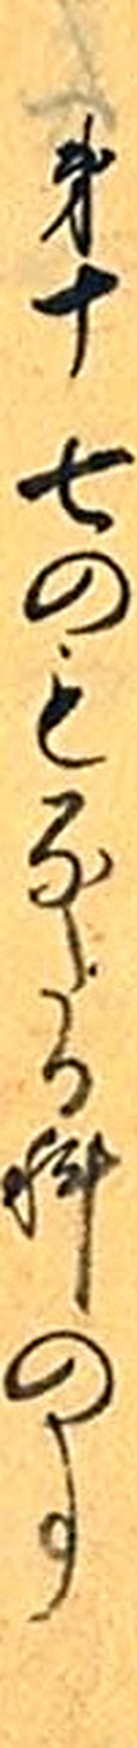第十七のもるたる科の事
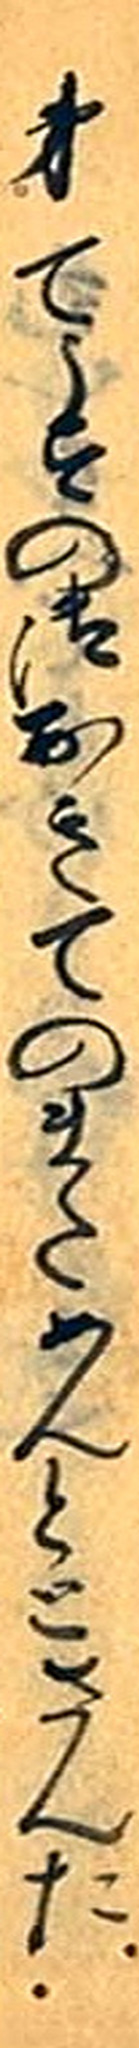弟てうすの御おきてのまためんととさんた
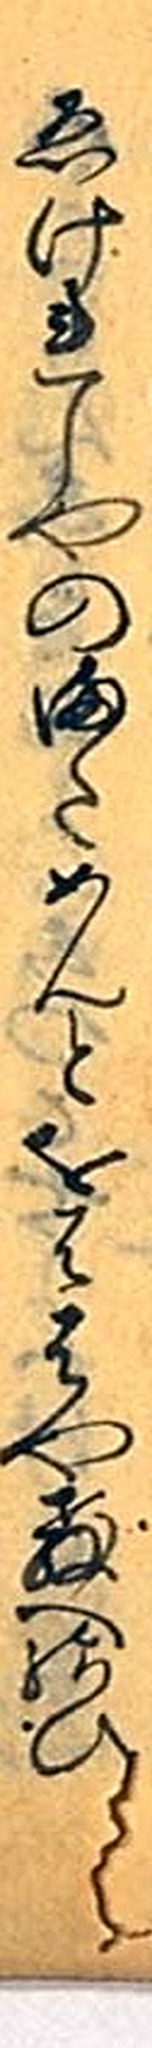ゑけれしやのまためんとをははや教へ給ひ
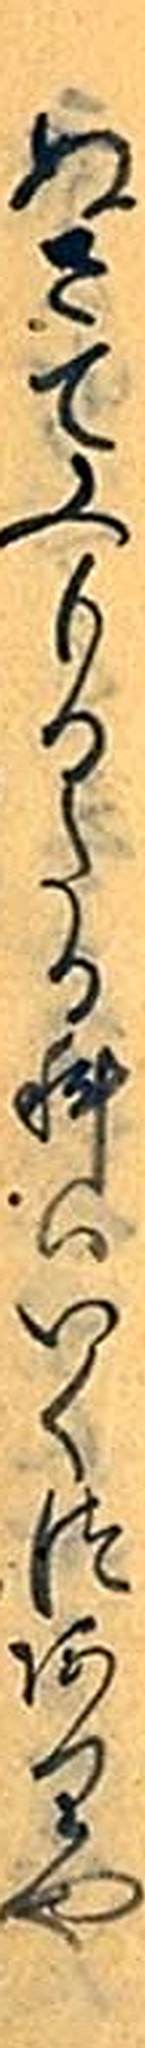ぬさて又もるたる科はいくつありや
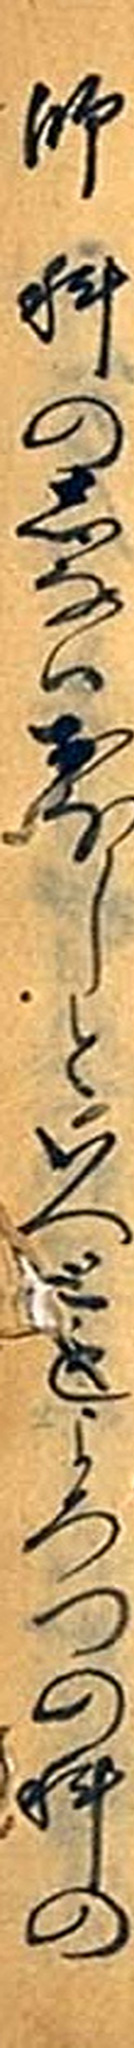師科のしなはおほしといへともよろつの科の
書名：ドチリナ・キリシタン
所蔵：東京大学総合図書館 / General Library in the University of Tokyo
